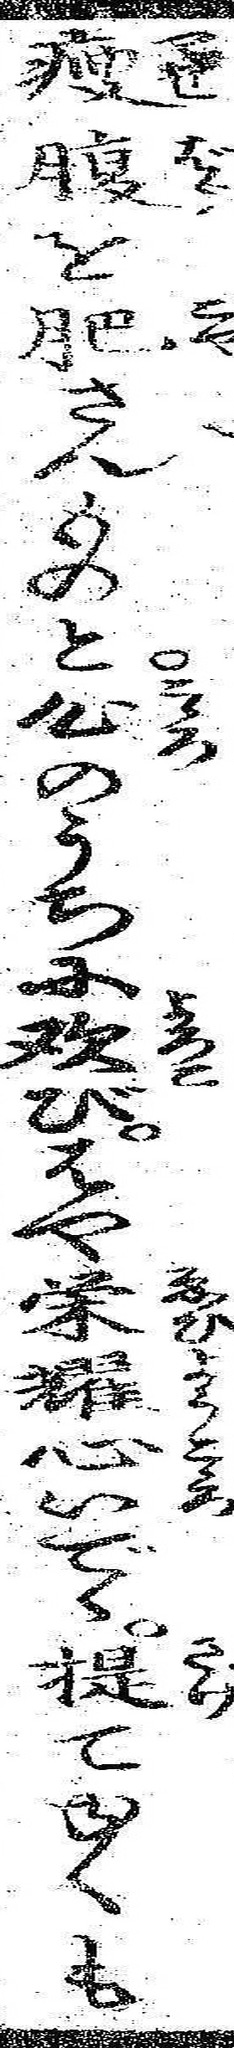痩腹を肥さんものと。心のうちに歓び。はや栄耀心いでゝ。提てゆくも
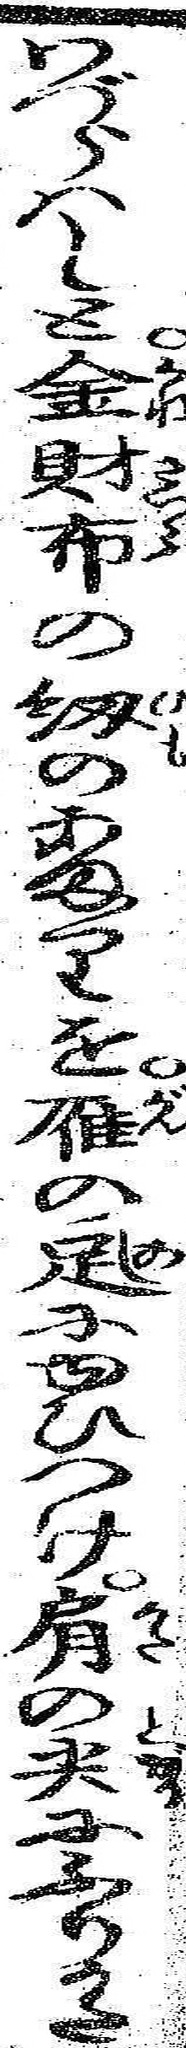わづらはしと。金財布の紐のあまりを。雁の足にゆひつけ。肩の尖にふりかた
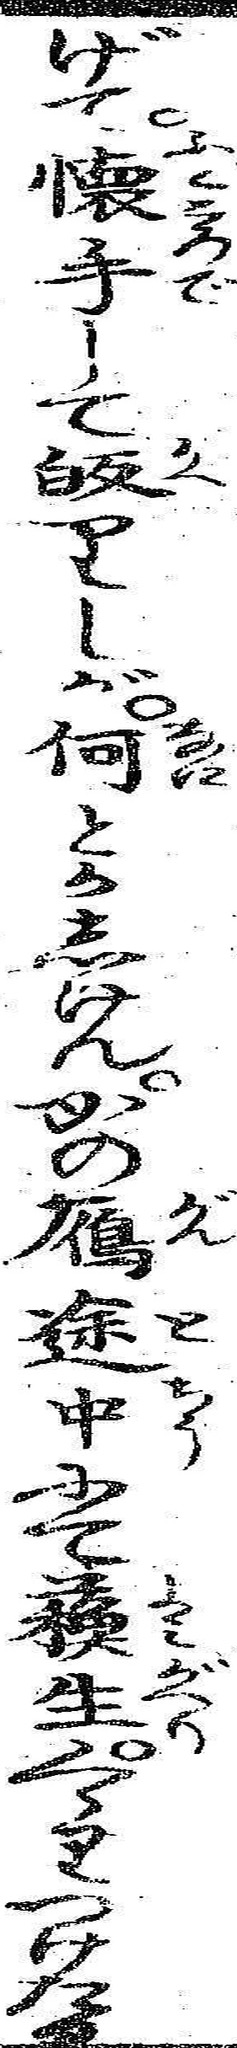げて。懐手して帰りしが。何とかしけん。かの雁途中にて蘇生。くゝりつけたる
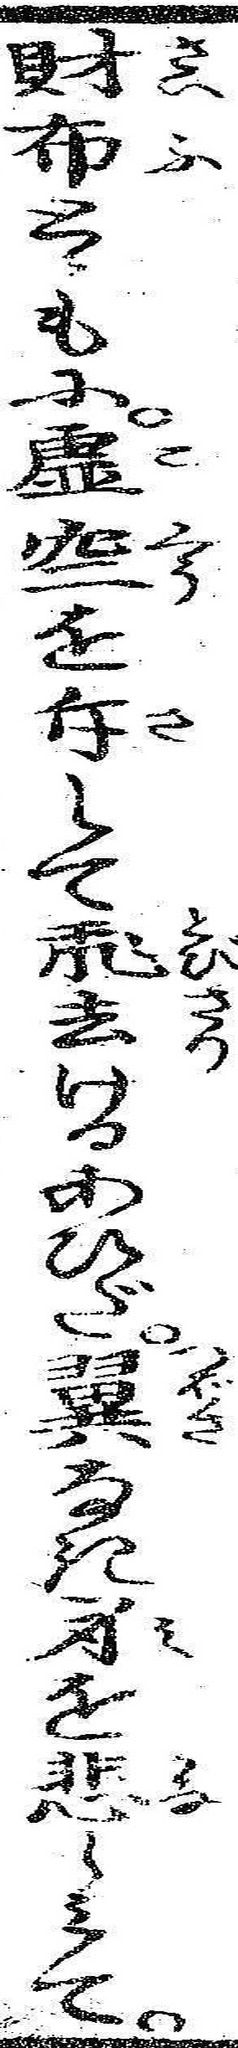財布とゝもに。虚空を斥して飛去けるあひだ。翼なき身を悲しみて。
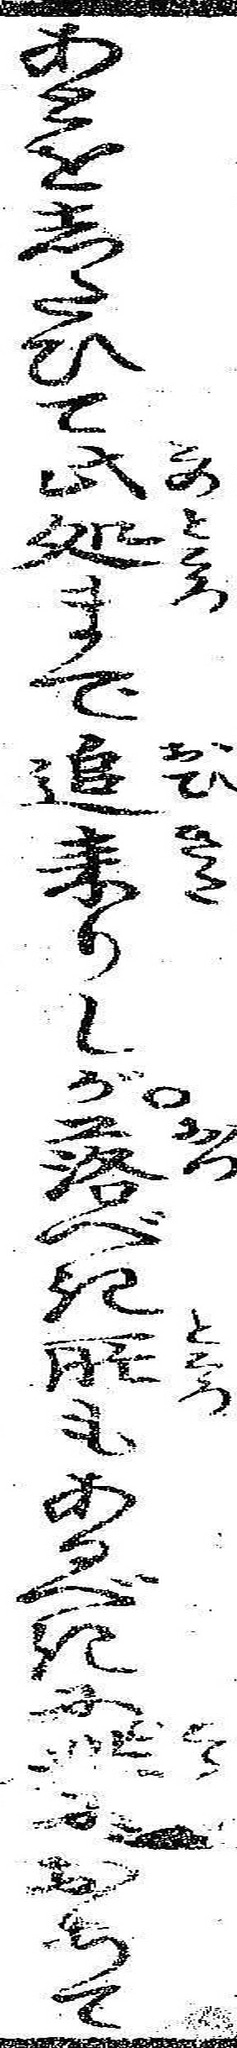あとをしたひて此処まで追来りしが。落べき所もあるべきに此におちて
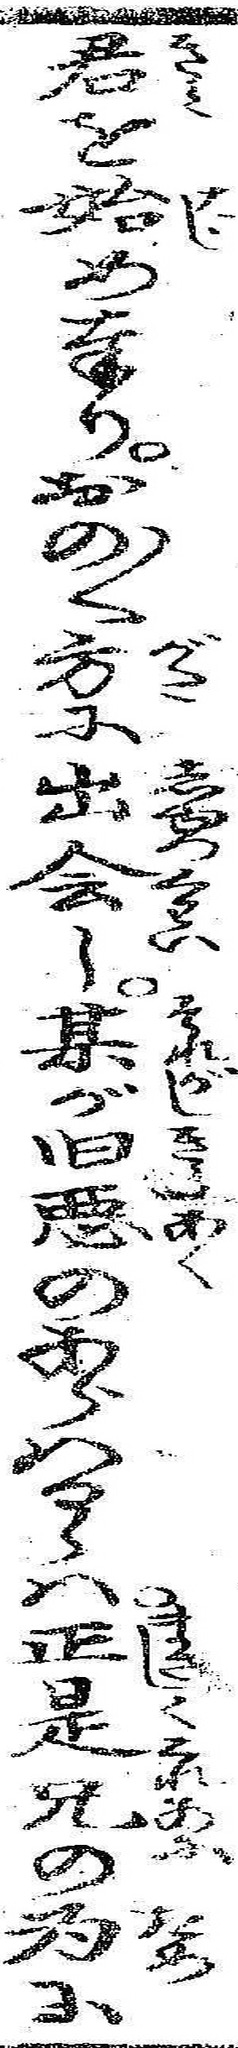君を始め奉り。おの〳〵方に出会し。某が旧悪のあらはるゝは。正是兄の為に
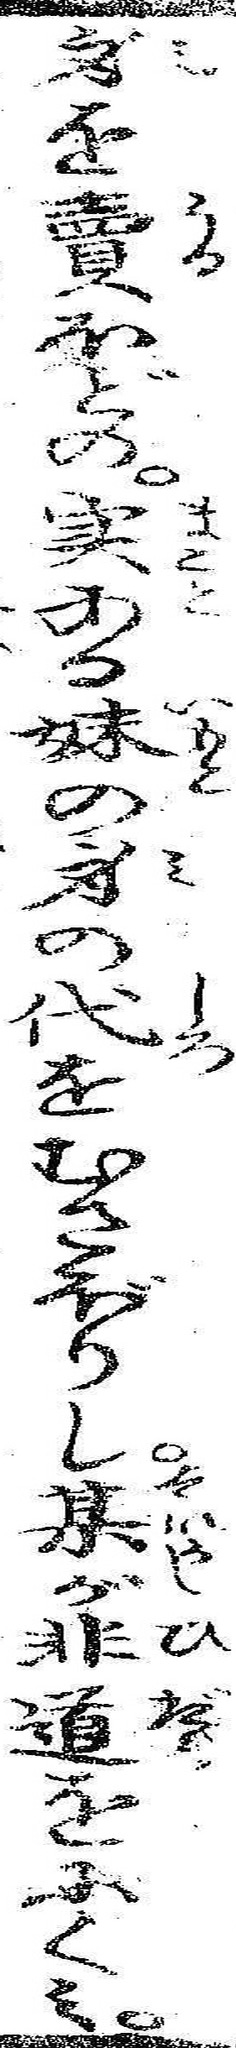身を売ほどの。実ある妹の身の代をむさぼりし。某が非道をにくみ。
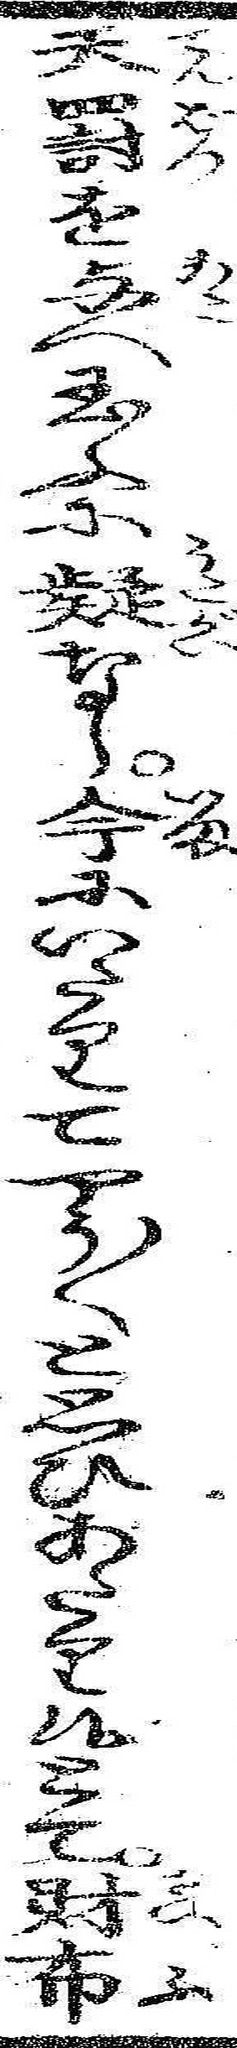天罰を与へ玉ふに疑なし。今にいたりてやう〳〵と思ひあたり候とて。財布
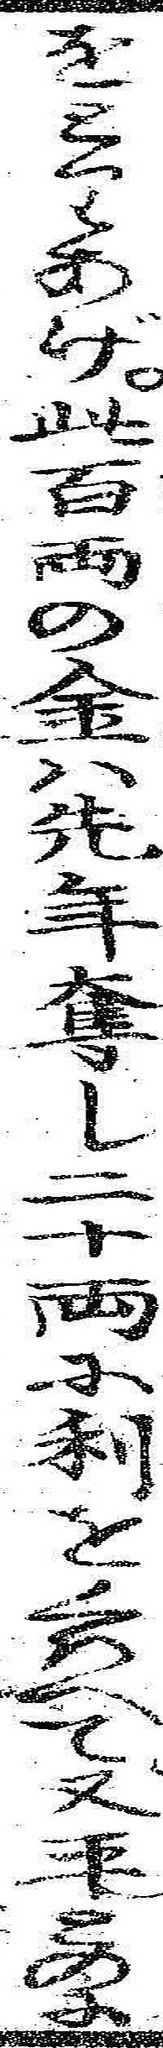をとりあげ。此百両の金は先年奪し二十両に利をくはへて。又平とのに
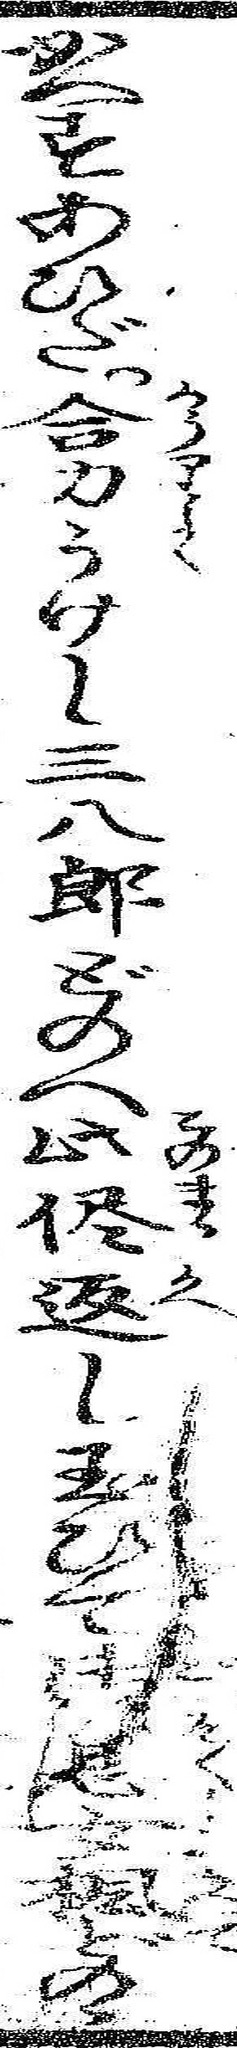かへすあひだ。合力うけし三八郎どのへ此侭返し玉ひて。御息女楓どのゝ
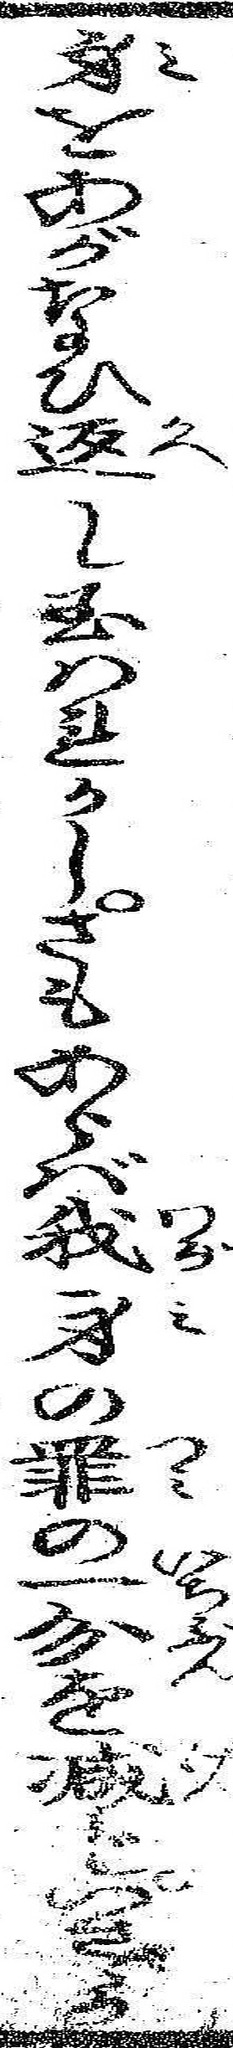身をあがなひ返し玉はれかし。さもあらば我身の罪の一分を減じ。いさゝか
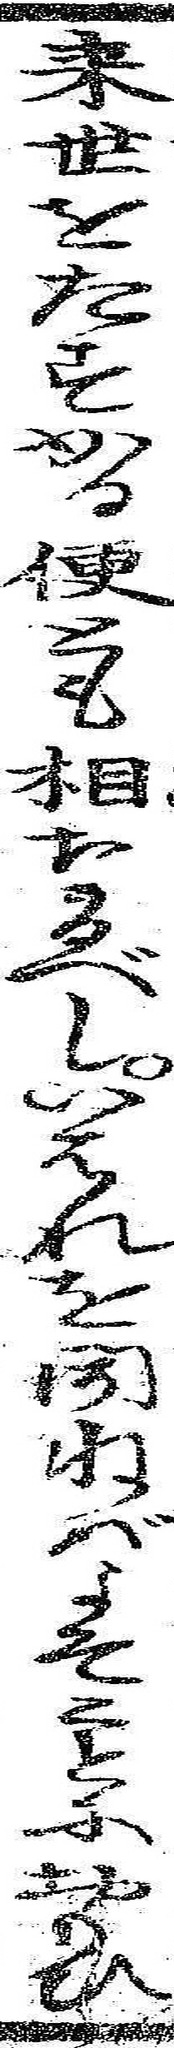来世をたすかる便とも相なるべし。いはれを聞ねばよそことにおもひ

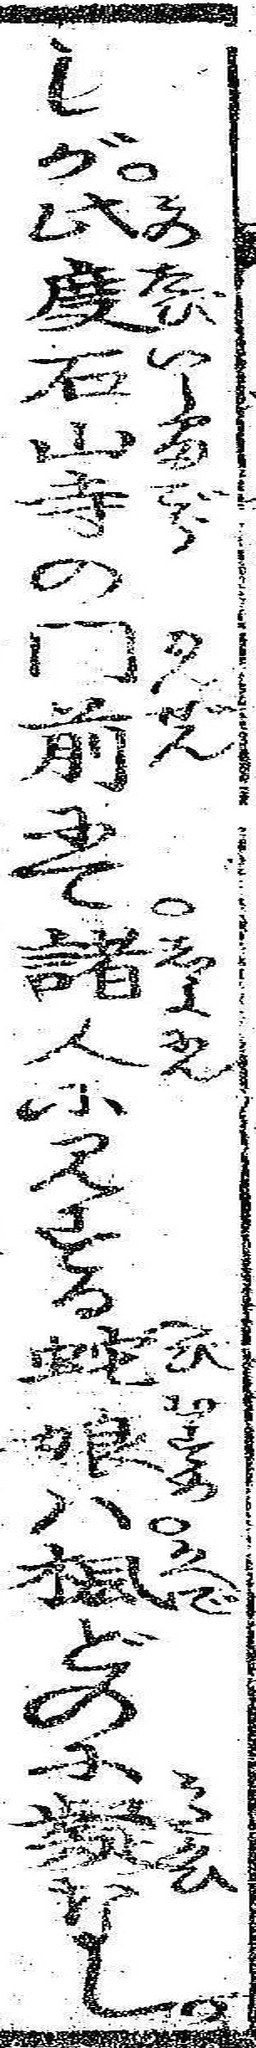しが。此度石山寺の門前にて。諸人に見する蛇娘は。楓どのに疑なし。
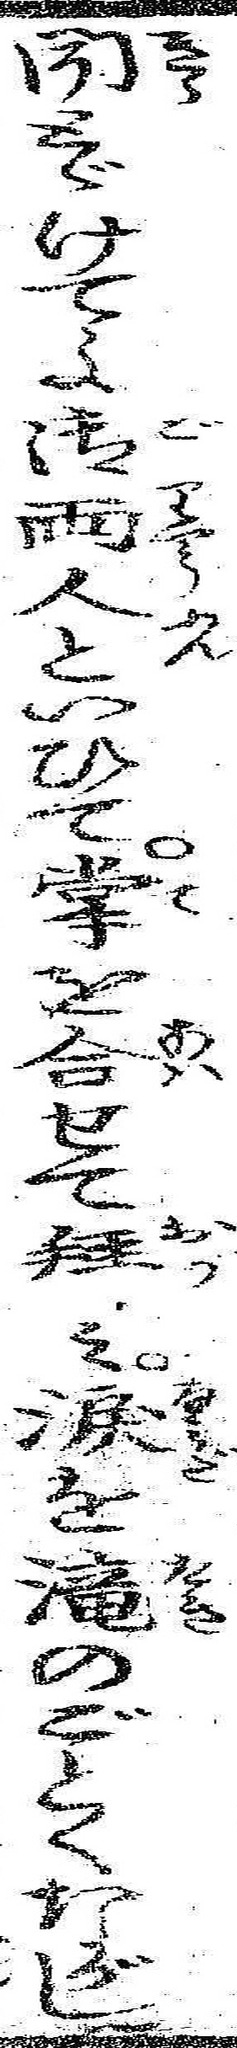聞とゞけてよ御両人といひて。掌を合せて拝み。涙を滝のごとくながし
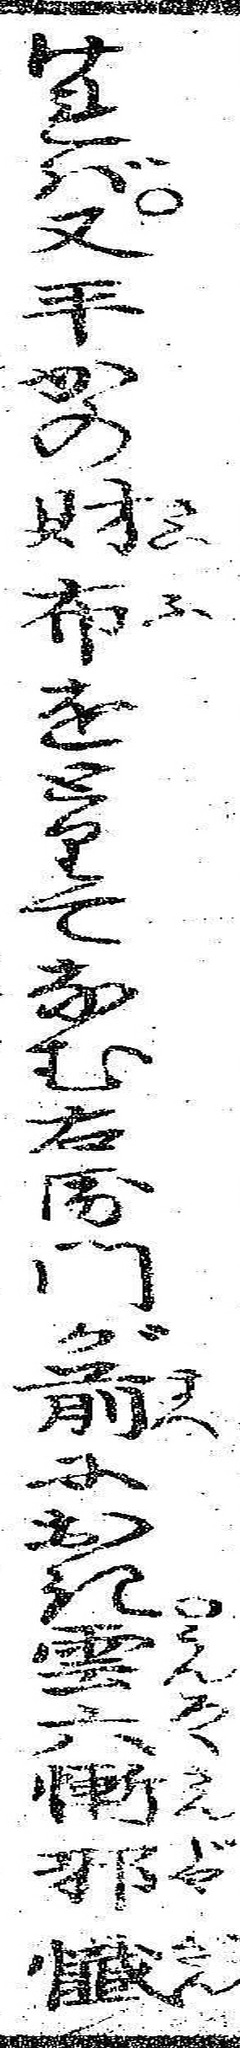ければ。又平かの財布をとりてなむ右衛門が前におき。雲六慚邪懺
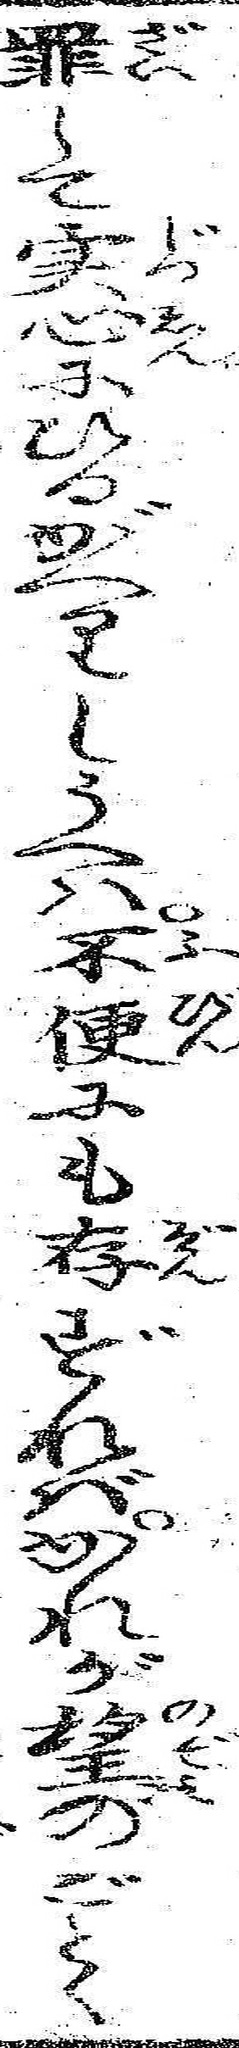罪して実心にひるがへりしうへは。不便にも存ずれば。かれが望のごとく
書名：昔話稲妻表紙
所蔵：国文学研究資料館
